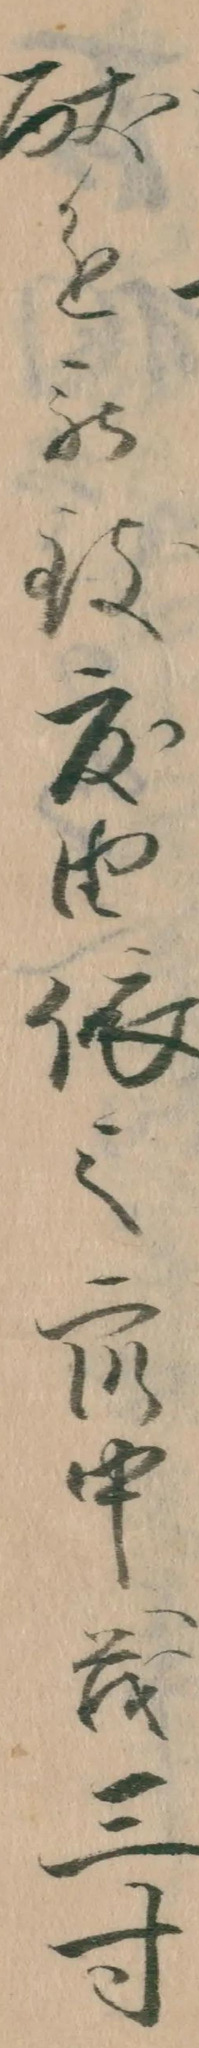献進被致度由依之衆中へ茂三寸
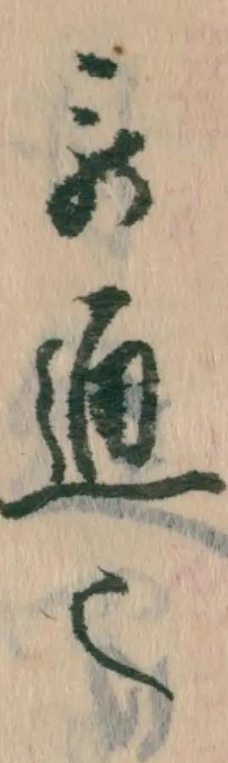被通也
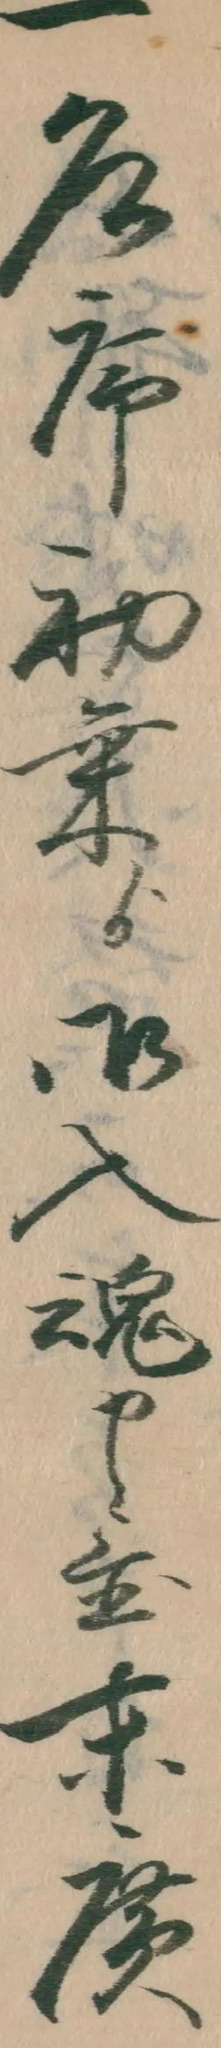一差席初乗ゟ御入魂申置末廣
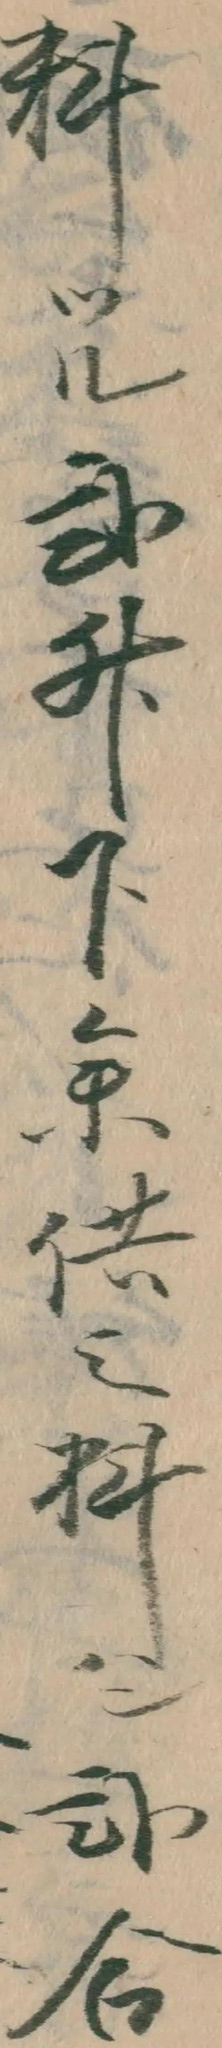料ツル弐升下参供之料ハン弐合
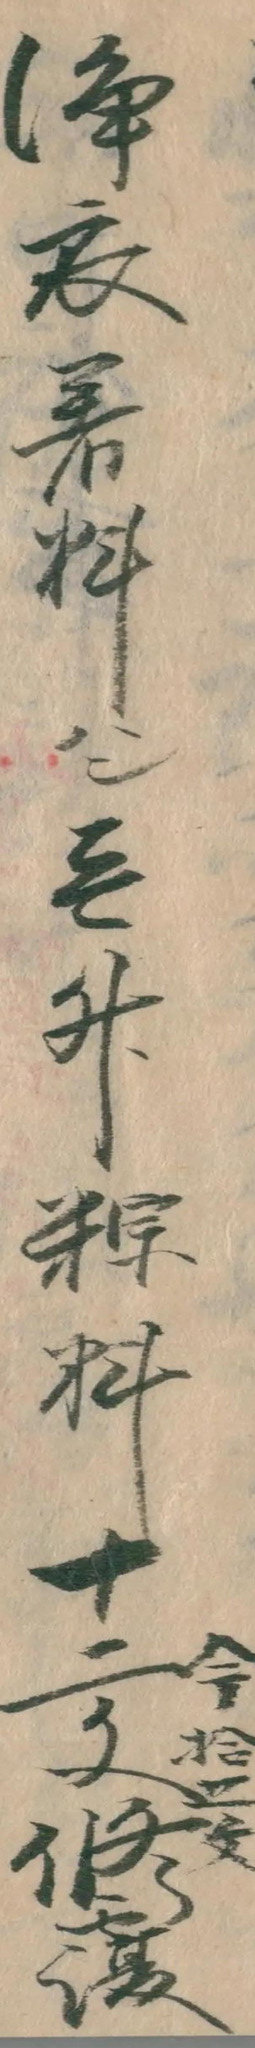浄衣着料ハン壱升粽料/十二文修覆
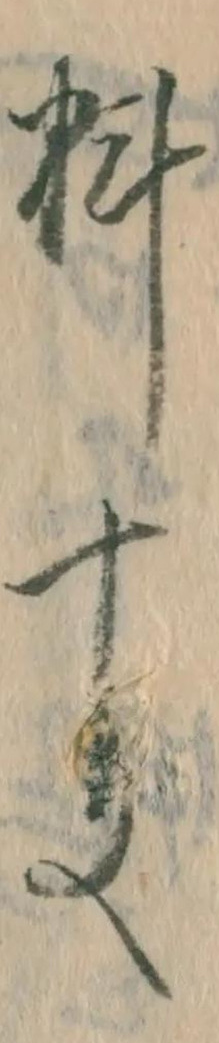料十文
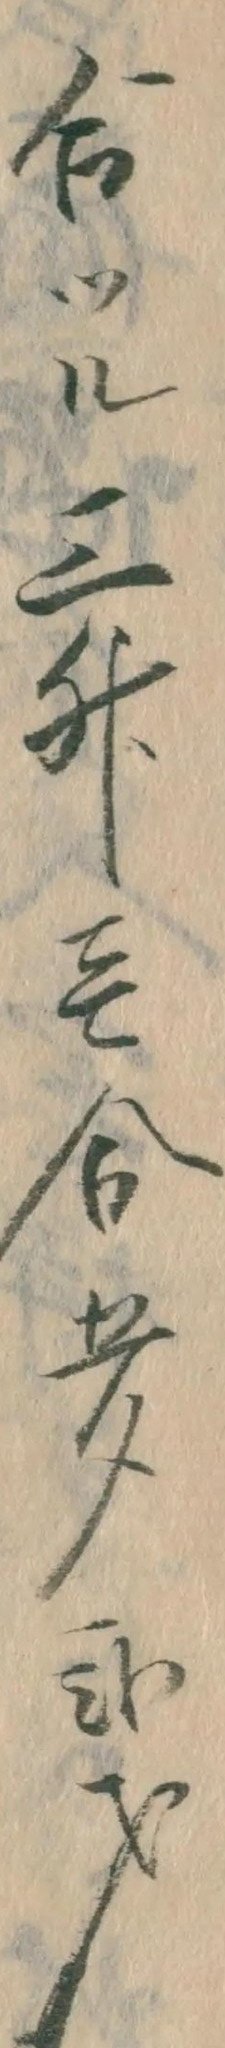合ツル三升壱合五夕弐才
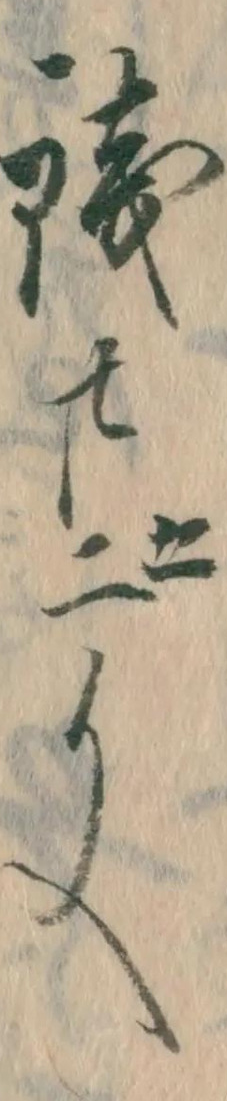銭廿/二文
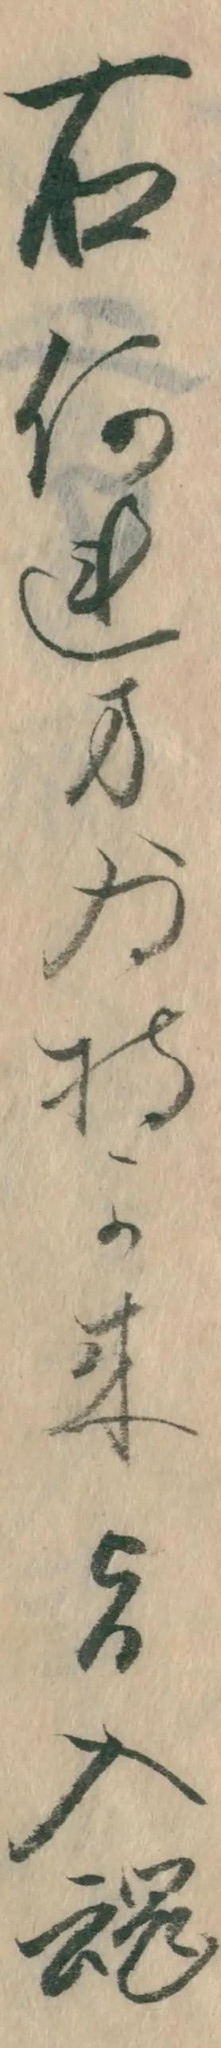右何れ方為持可来旨入魂

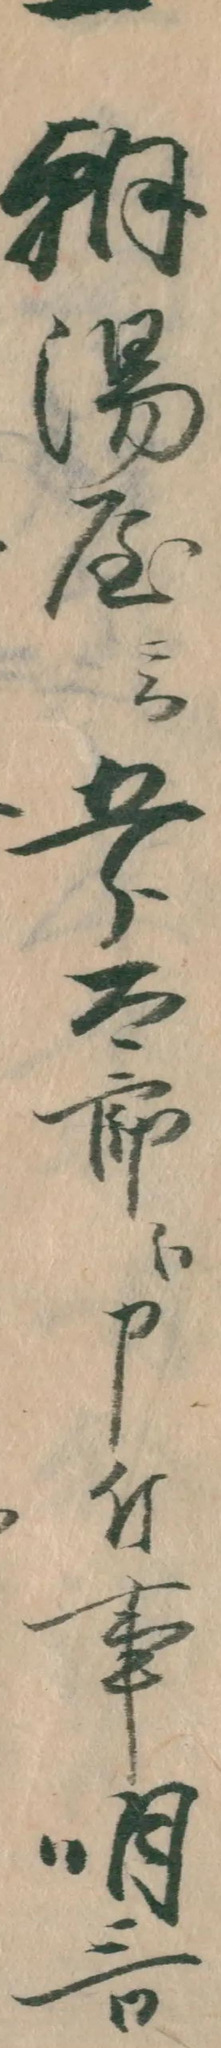一朝湯屋ニ而五郎太郎江申付事明三日
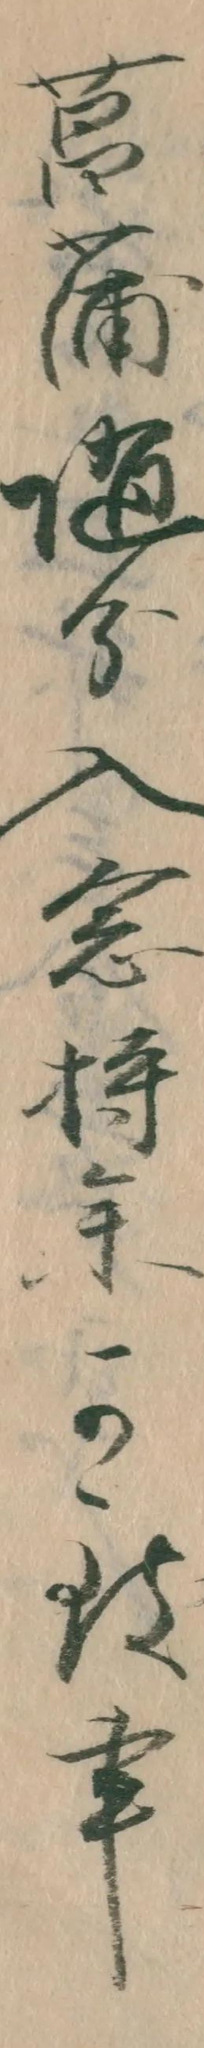菖蒲随分入念持参可致事
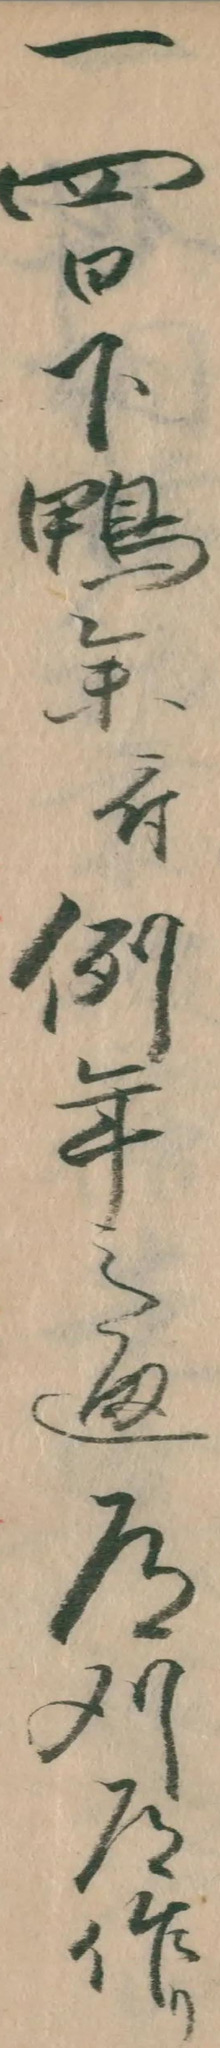一四日下鴨参ニ付例年之通道刈道作り
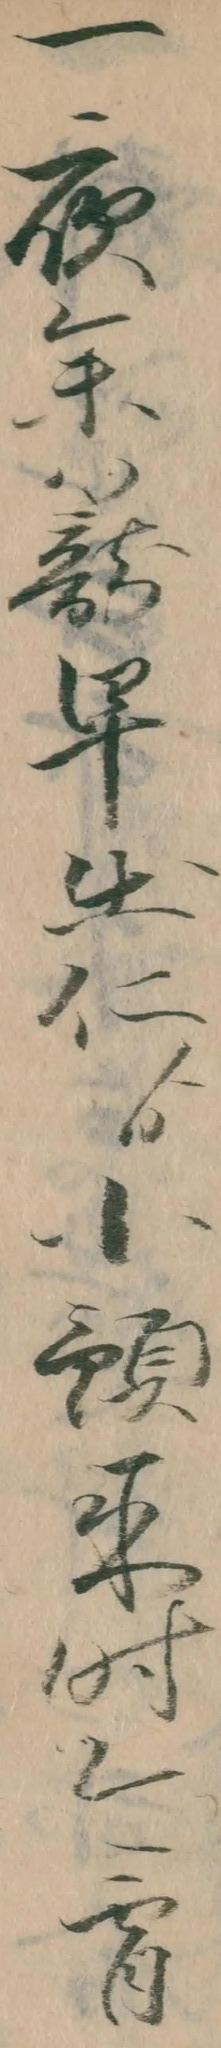一夜参籠早出にゟ小預来時今宵
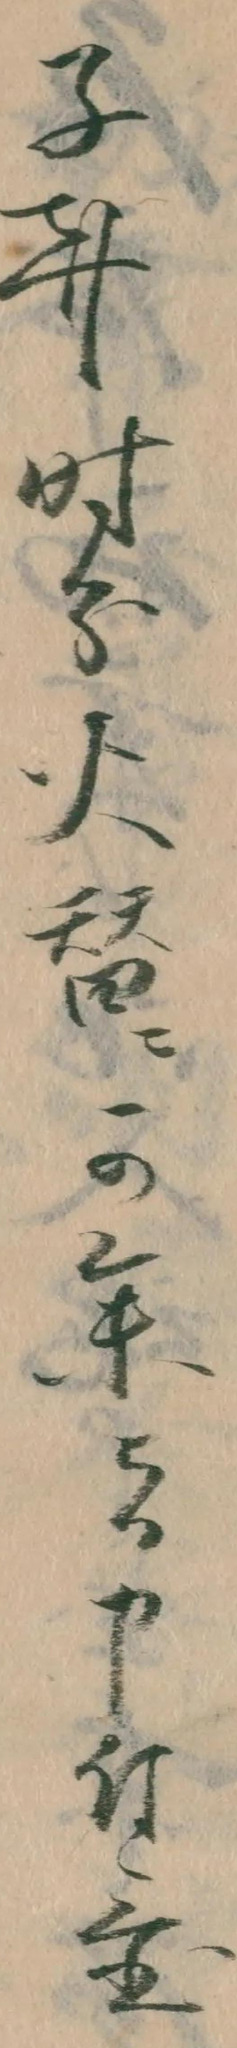子刻時分火替ニ可参旨申付置
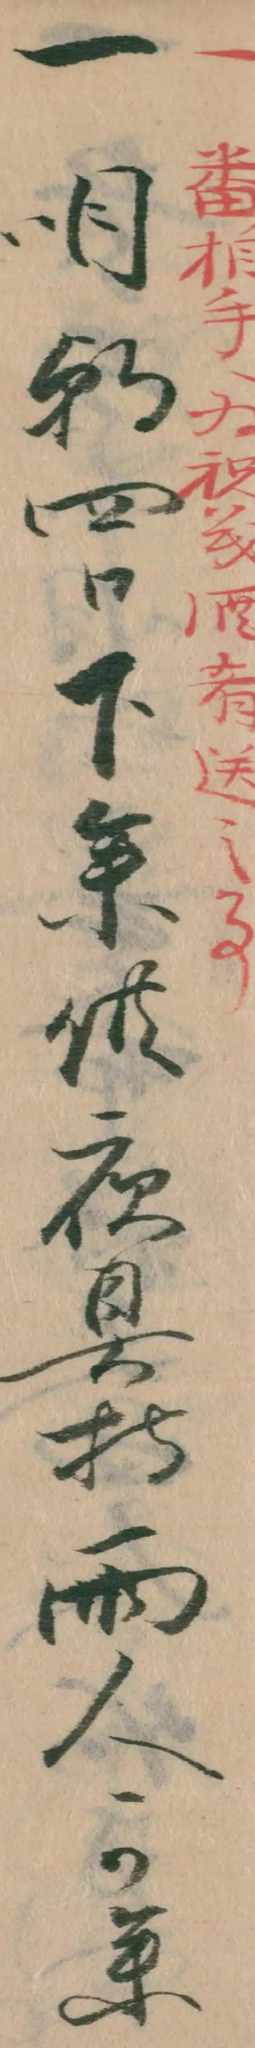一明朝四日下参供夜具持両人可参
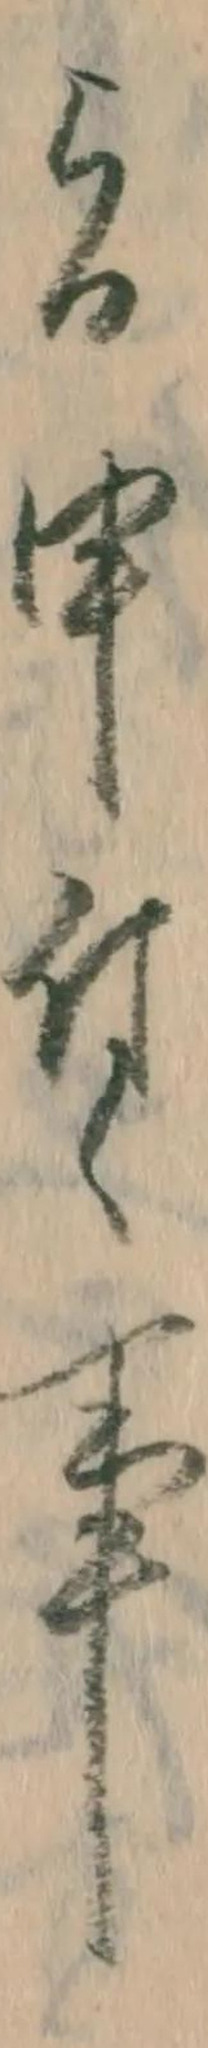旨申付候事
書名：賀茂社記録. 第11冊
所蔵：国立国会図書館 National Diet Library, JAPAN
